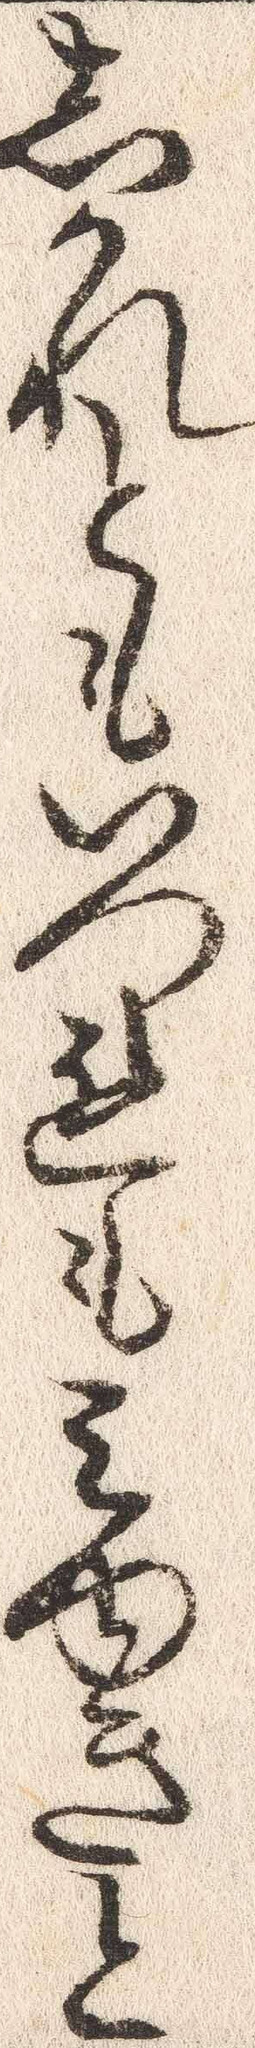しかれともいつれもみゆきと
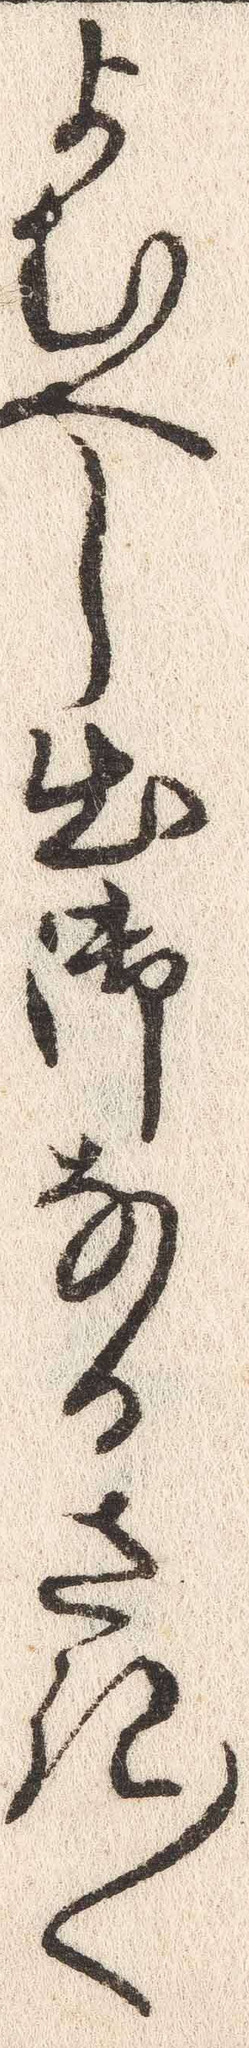よむへし出御なるさき〳〵
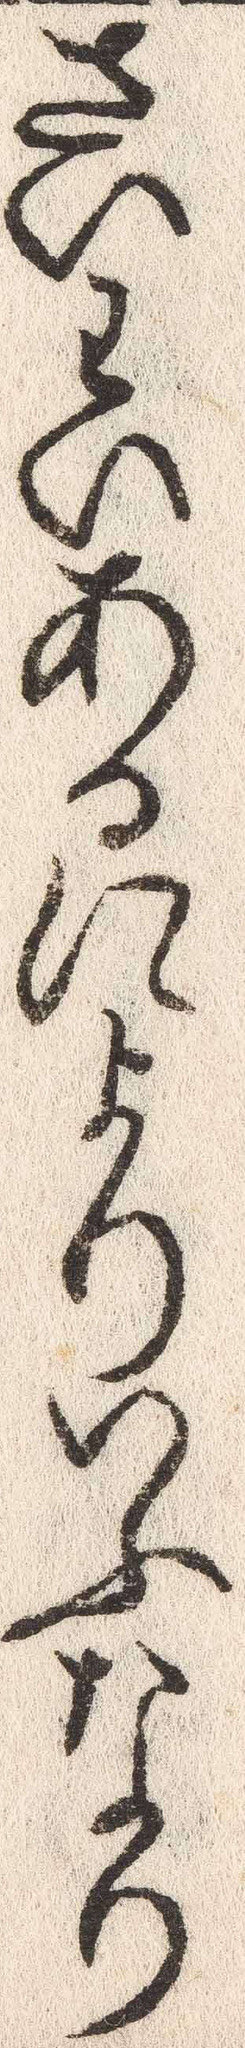さいわいあるによりいふなり
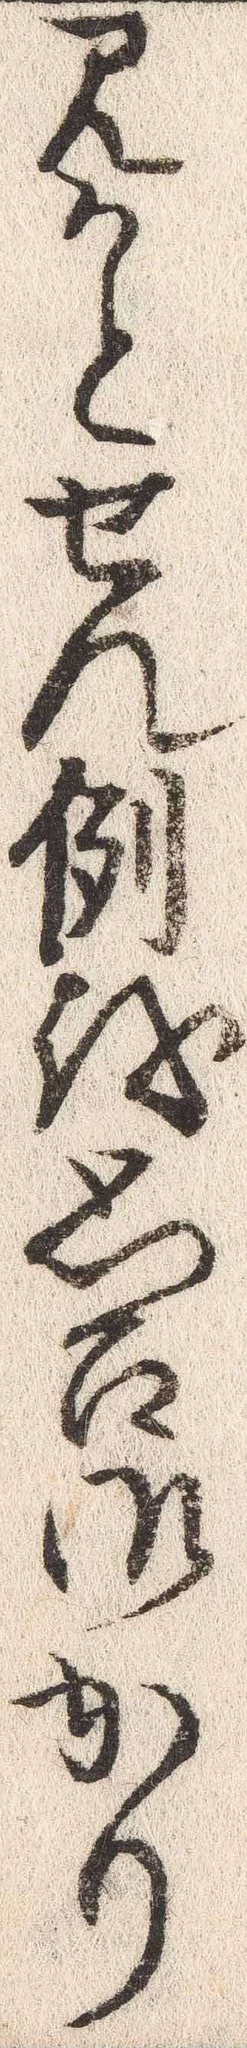みかとせん例を思召御かり

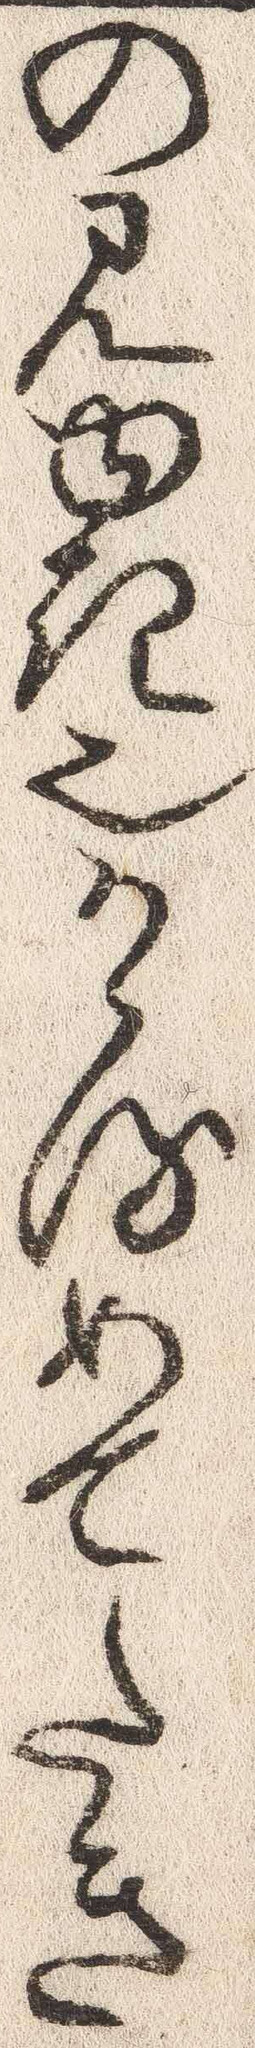のみゆき也かゝるめてたき
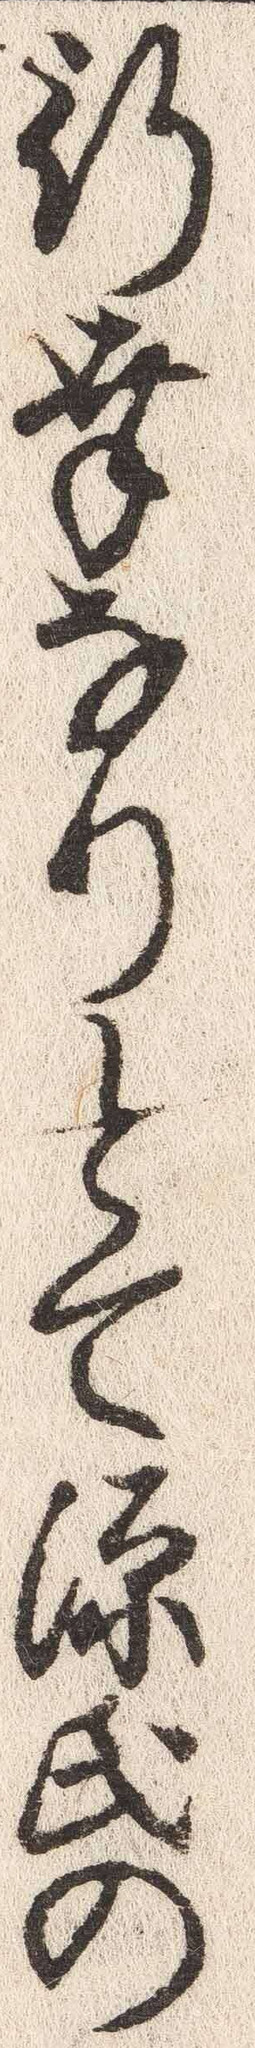行幸なりとて源氏の
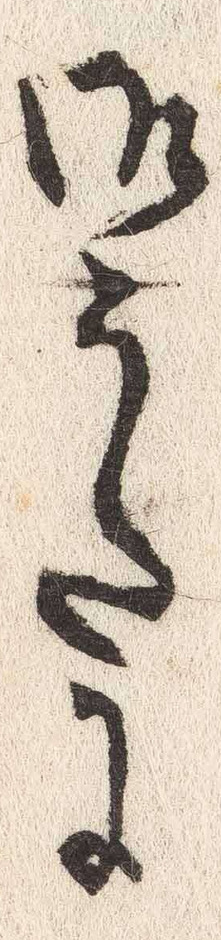御うたに
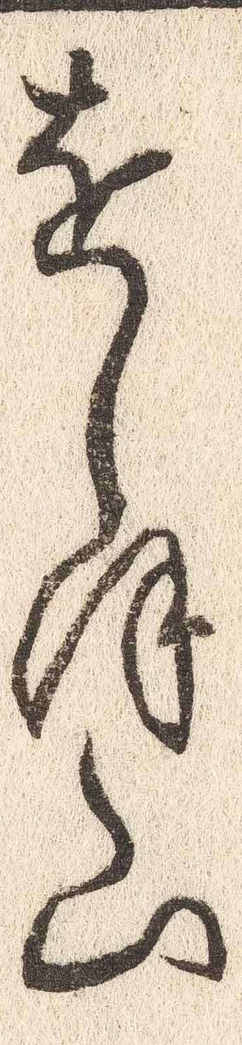をしほ山
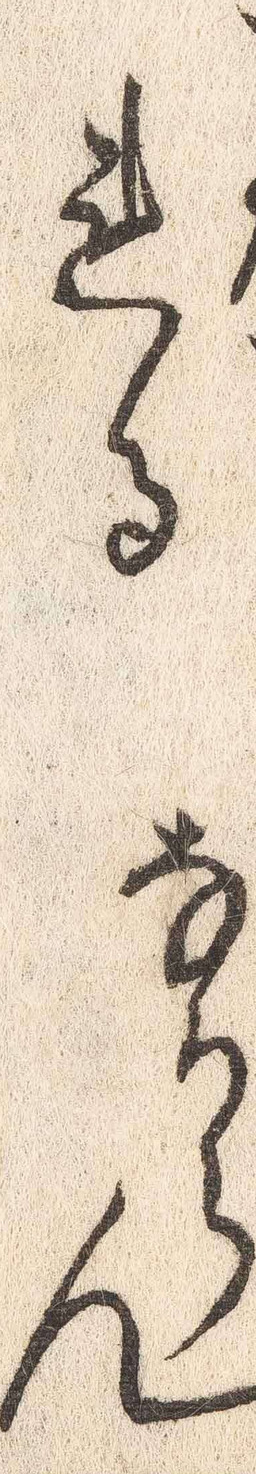れるなから
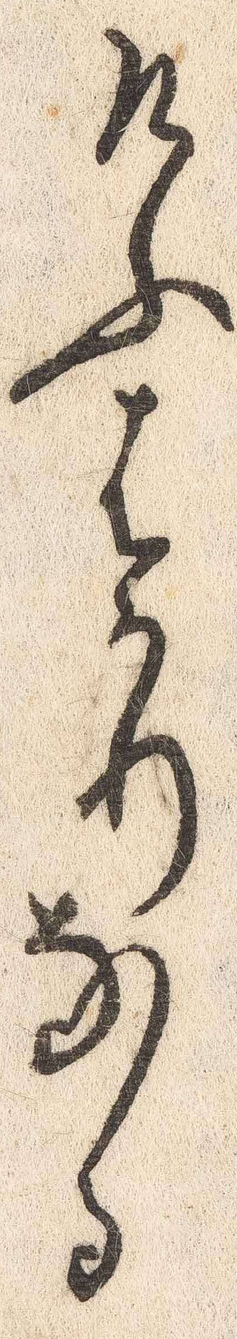けふはかりなる

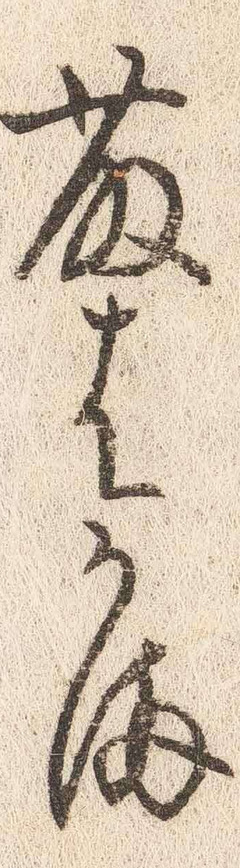藤はかま
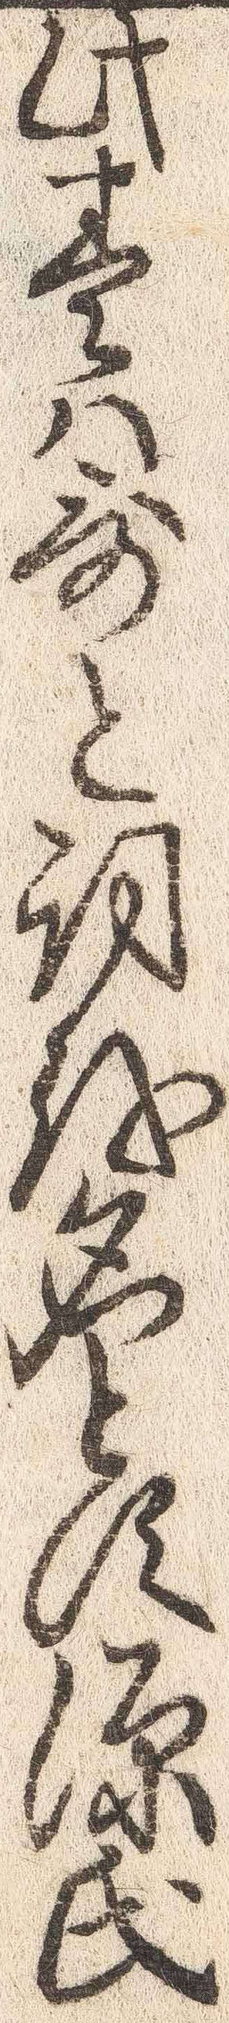此巻は歌と詞を名とす源氏
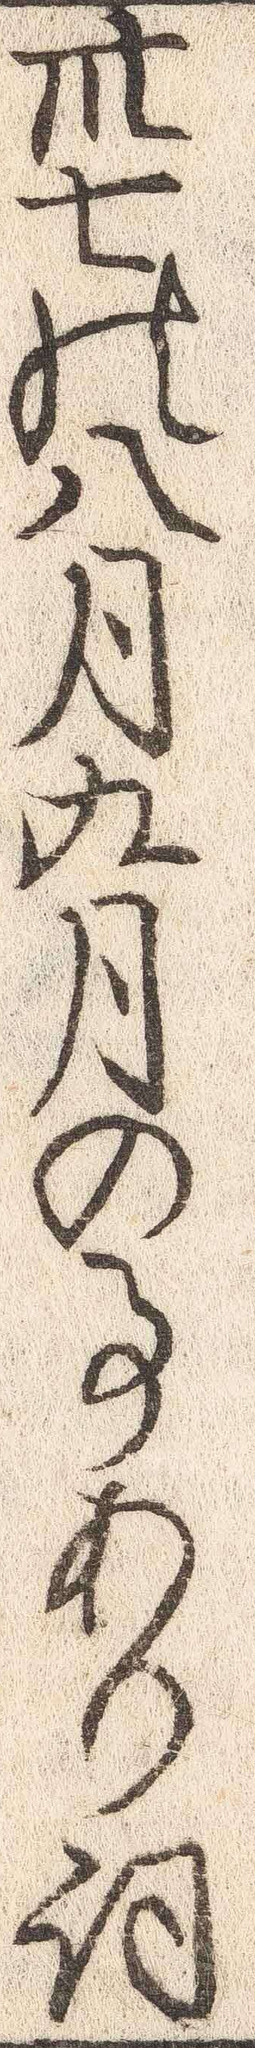卅七の八月九月の事あり詞
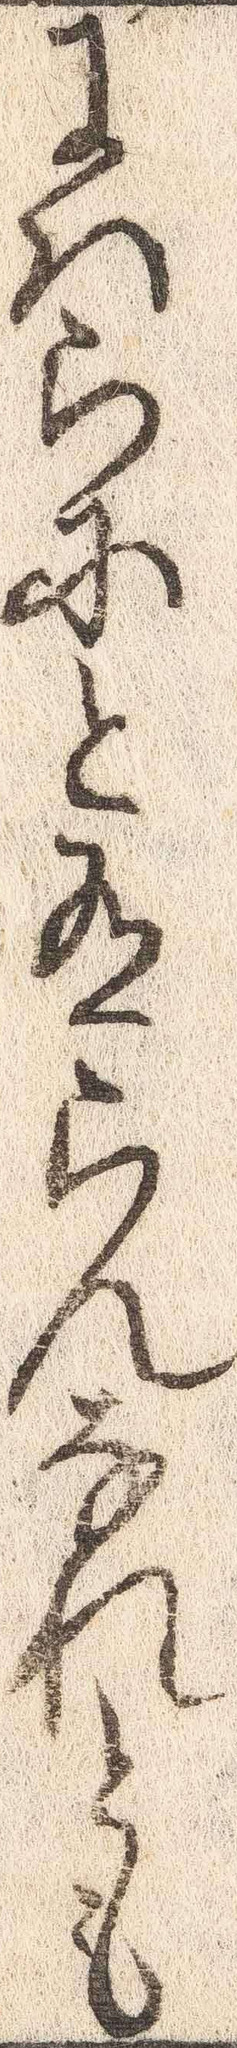にはらにと有らんなれとも
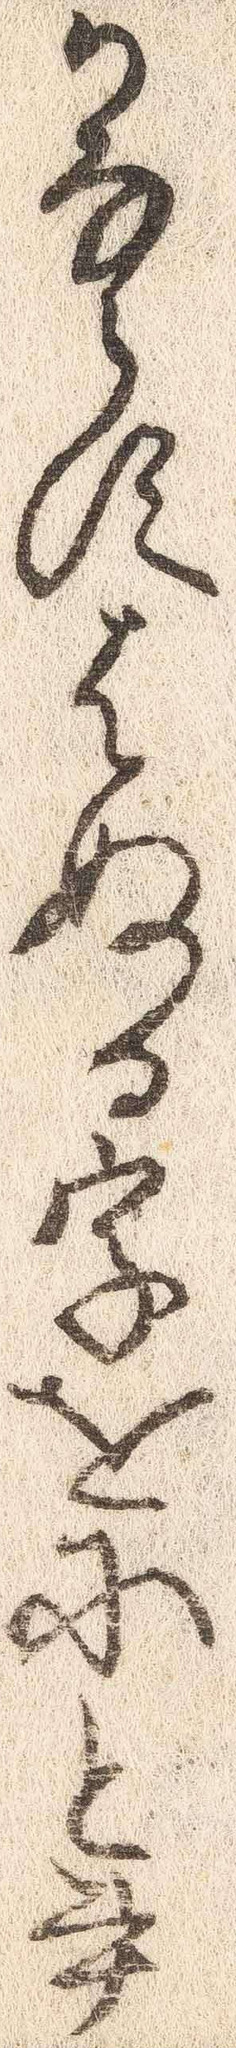かならすはぬる字をにと書
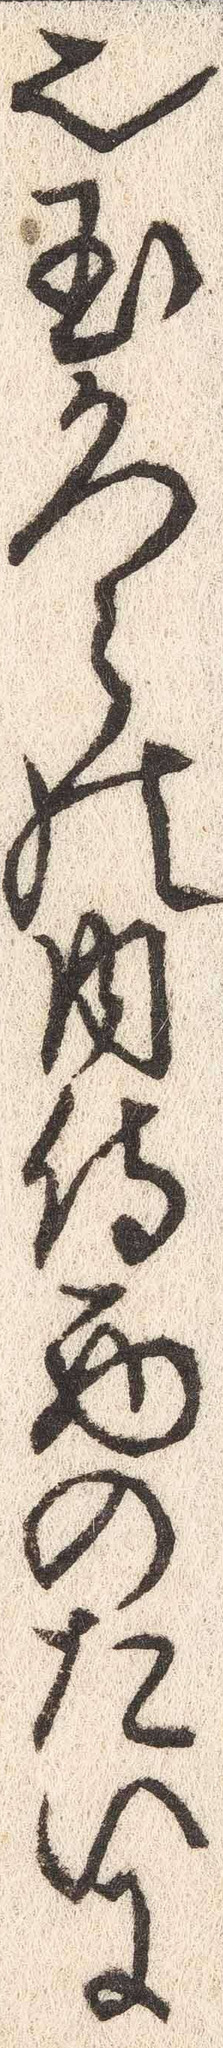也玉かつらの内侍西のたいに
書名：源氏物語
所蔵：東京学芸大学附属図書館 国文学研究資料館
